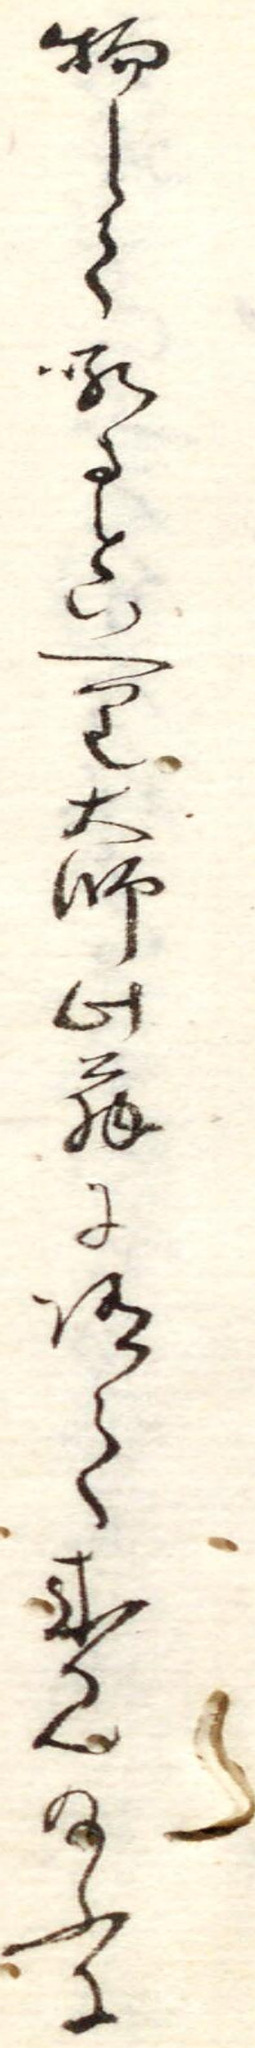物して吼るといへり大師此翁に語て来見給ふに
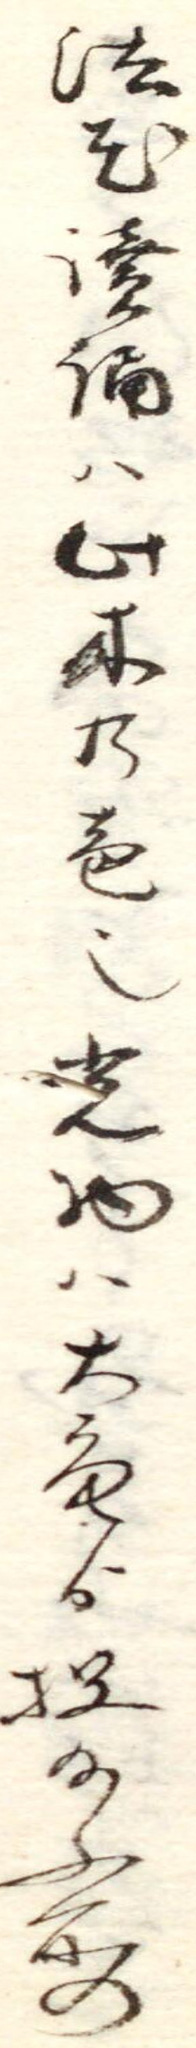法華読誦は此木の色也光物は大空ゟ投給ふ所の
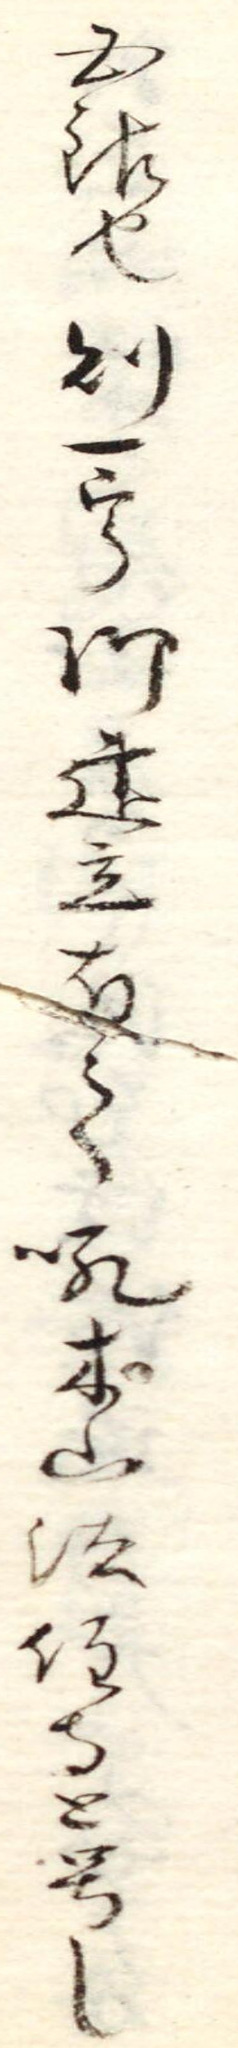五鈷也則一宇御建立有て吼木山法住寺と号し
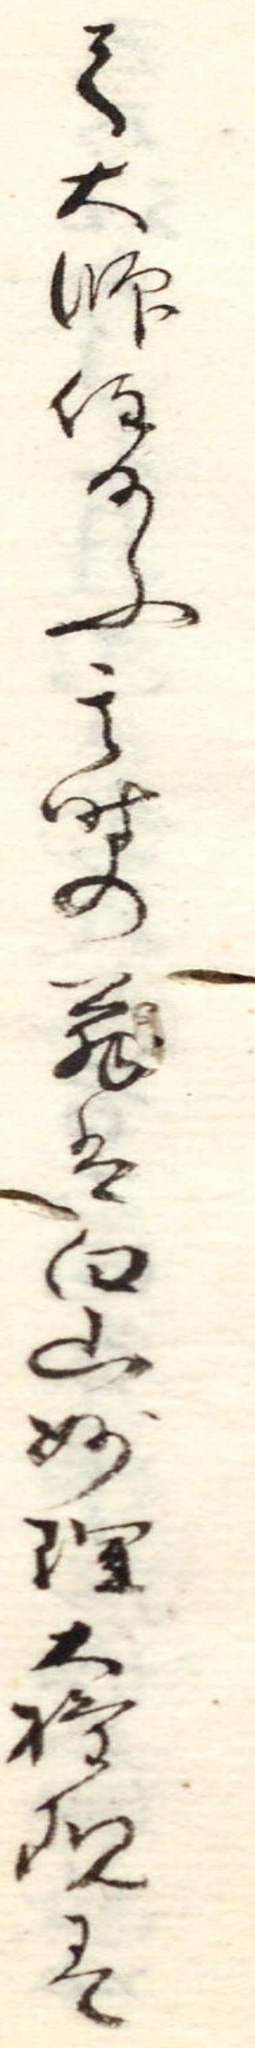て大師住給ふ其時の蔵は白山妙理大権現にて
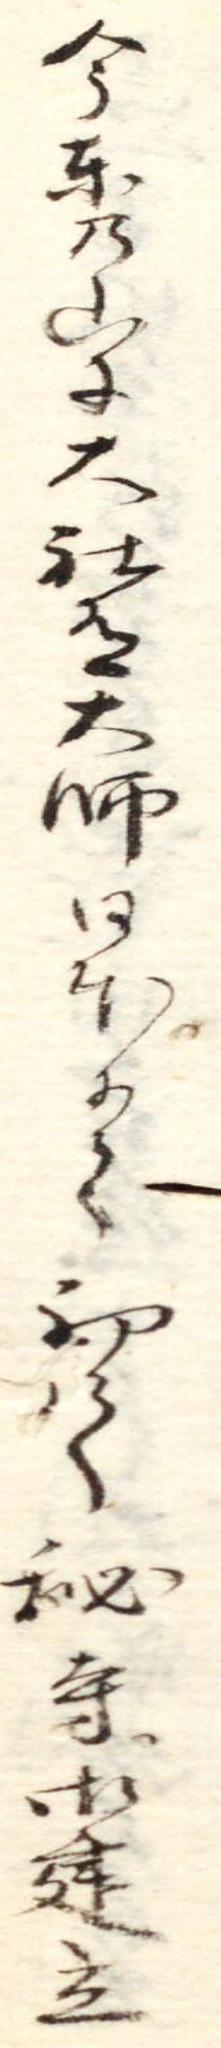今東の山に大社有大師日本にて初て秘寺建立
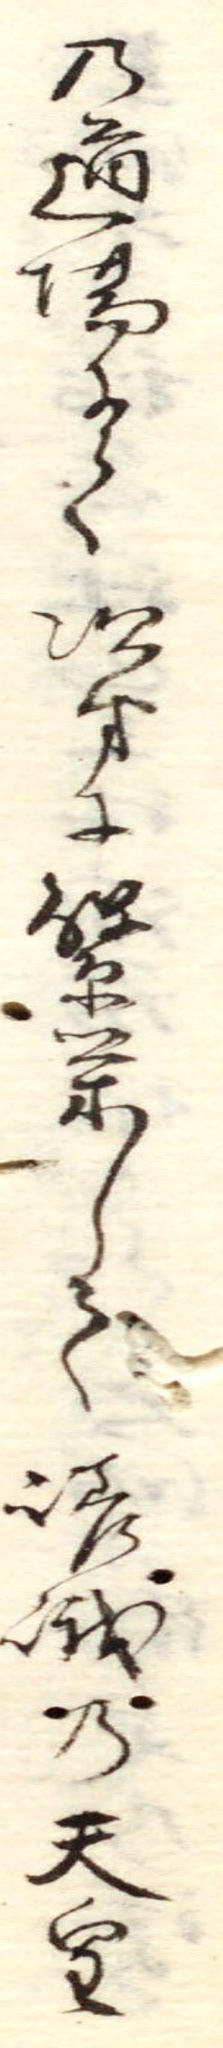の道場にて次第にはん繁栄し嵯峨の天皇
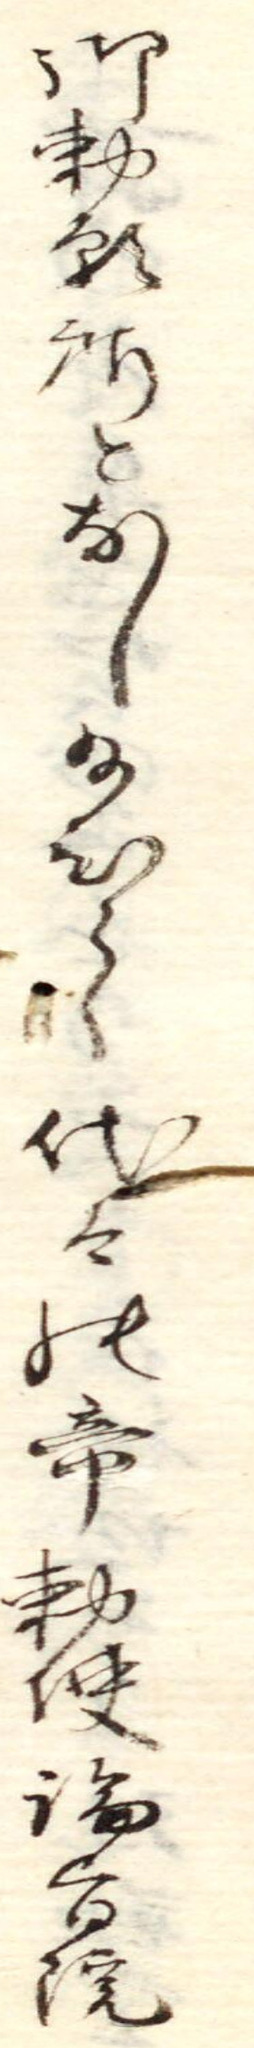御勅願所となし給ひて代々の帝勅使論旨院
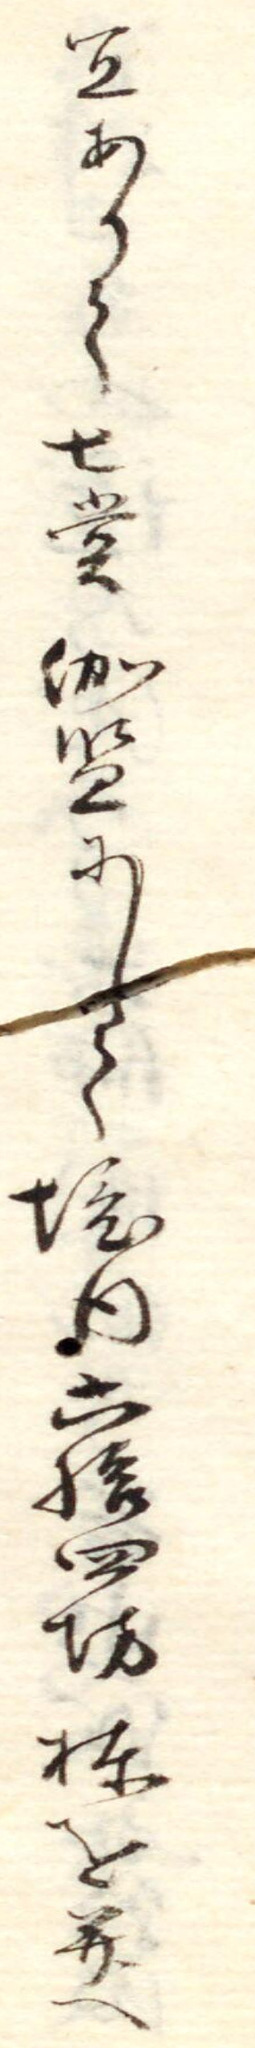宣ありて七堂伽藍にて境内六拾四坊棟を并へ
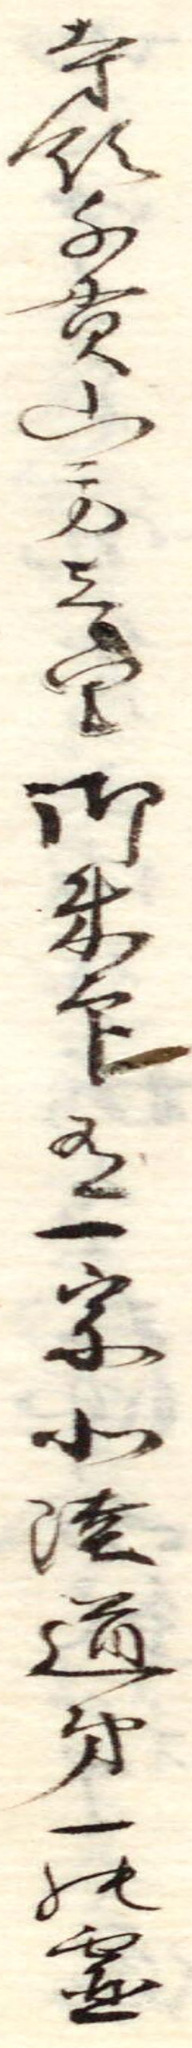寺領千貫山方三里御朱印有一宗北陸道第一の霊
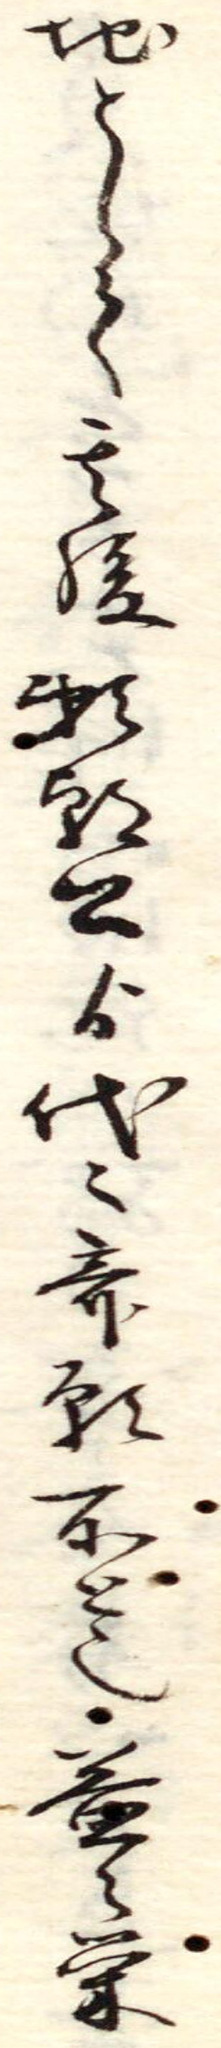地として其後頼朝公ゟ代々奇願所と也益々栄
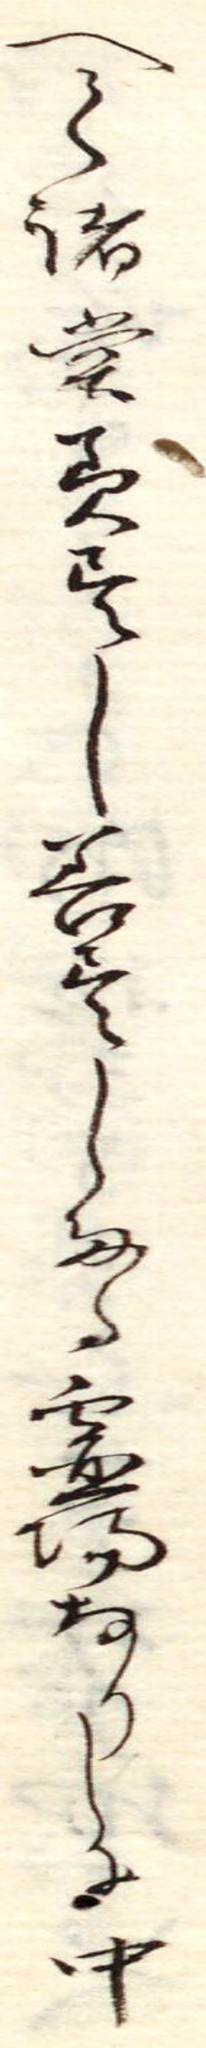へて諸堂美尽し善尽したる霊場なりしに中
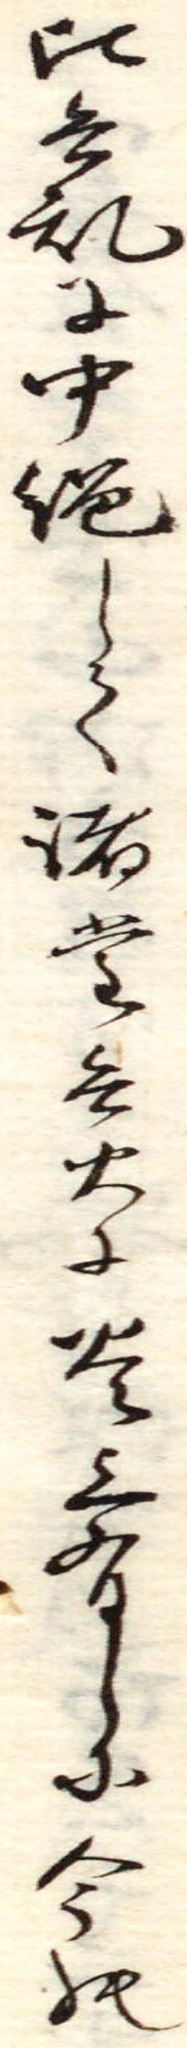頃兵乱に中絶して諸堂兵火に炎上有しに今の
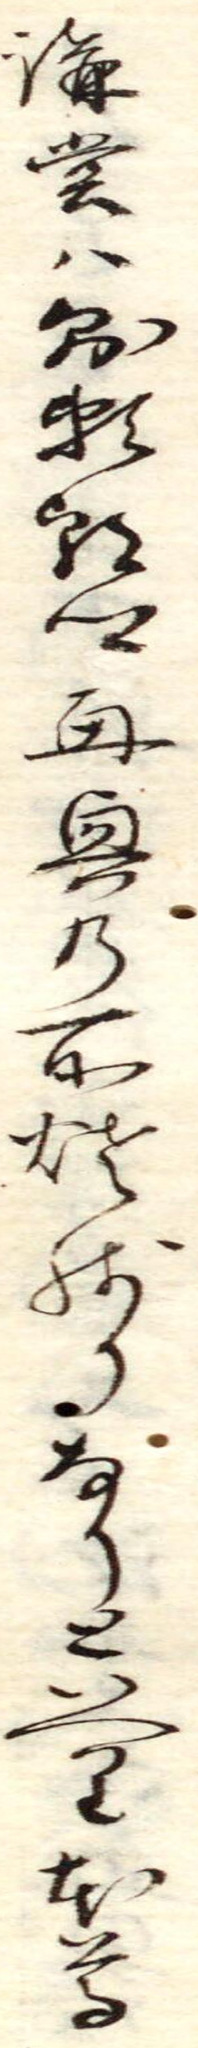講堂は則頼朝卿再興の所焼残りなりといへり本尊
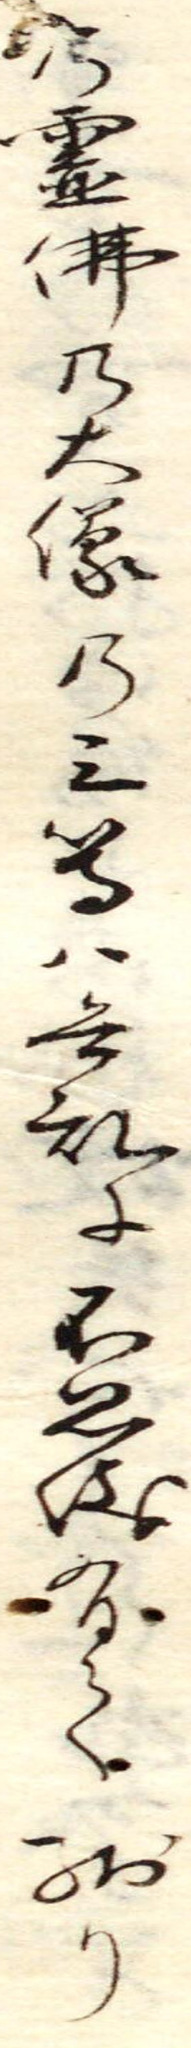の霊仏の大像の三尊は兵乱に不思議有て残り

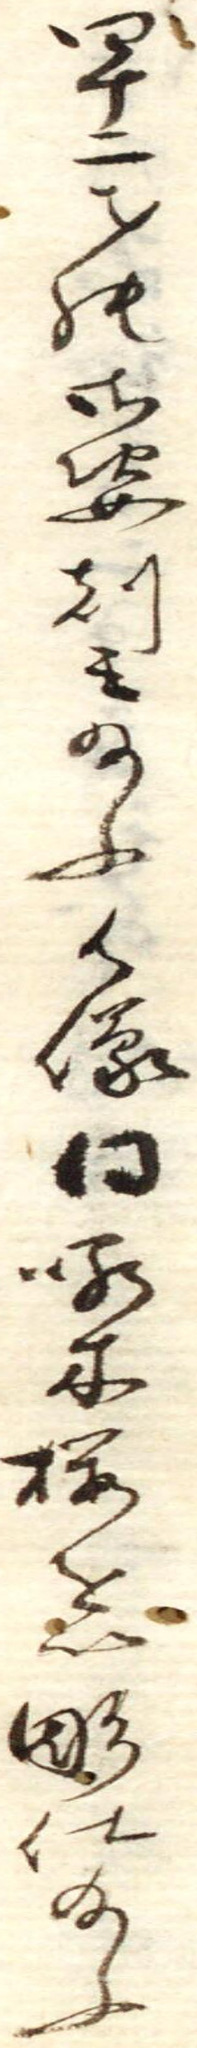四十二才の御姿刻み給ふ御像同吼木桜を以彫仕給ふ
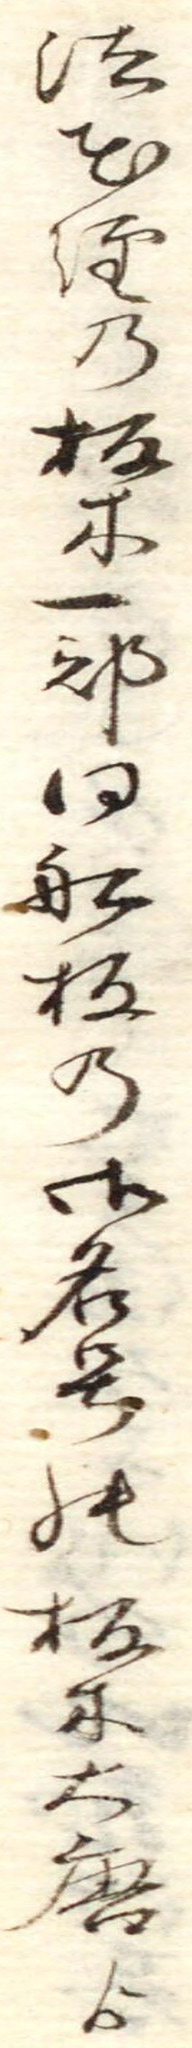法華経の板木一部同船板の御各号の板木大唐ゟ
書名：能登名跡誌
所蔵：Ishikawa Prefectural Library
